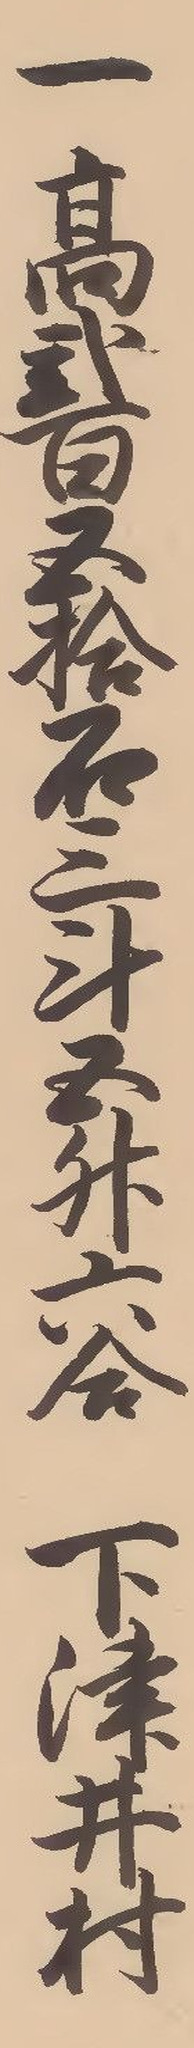一髙弐百五拾石三斗五升六合下津井村
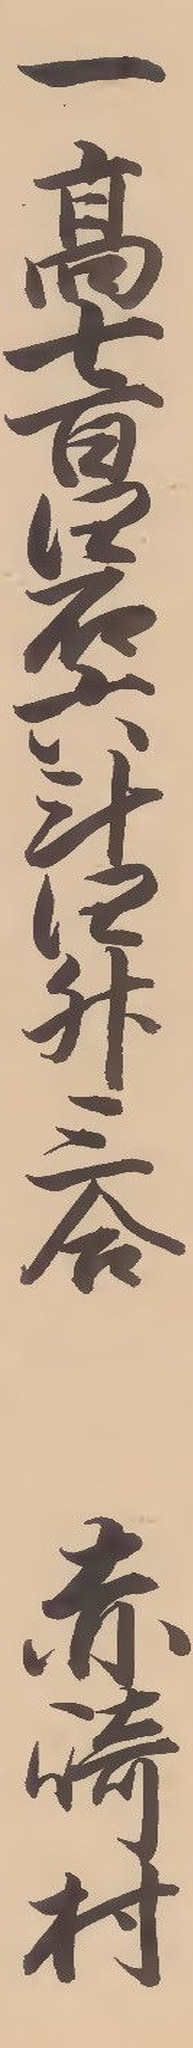一髙七百四石六斗四升三合赤崎村
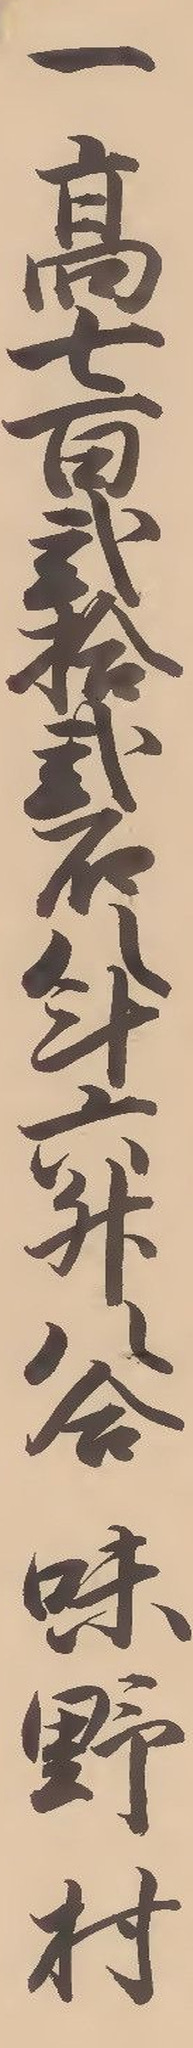一髙七百弐拾弐石八斗六升八合味野村

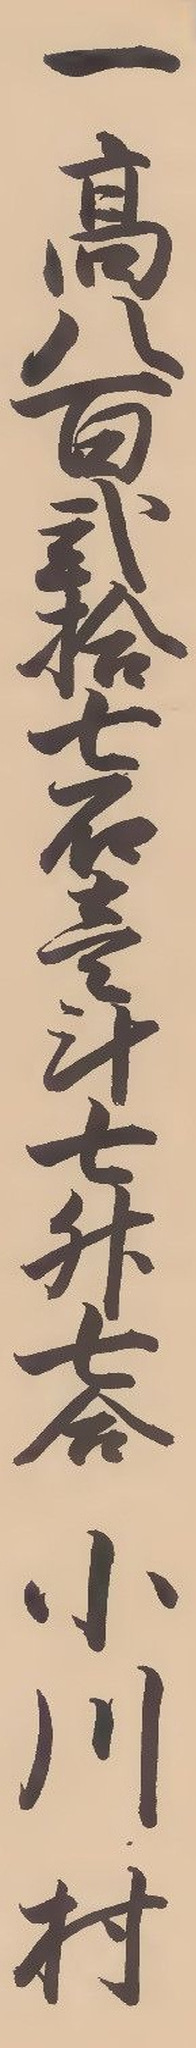一髙八百弐拾七石壱斗七升七合小川村
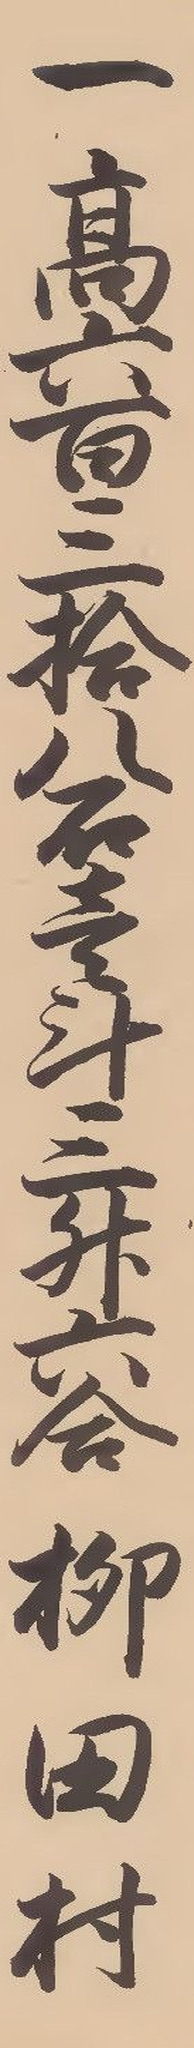一髙六百三拾八石壱斗三升六合柳田村
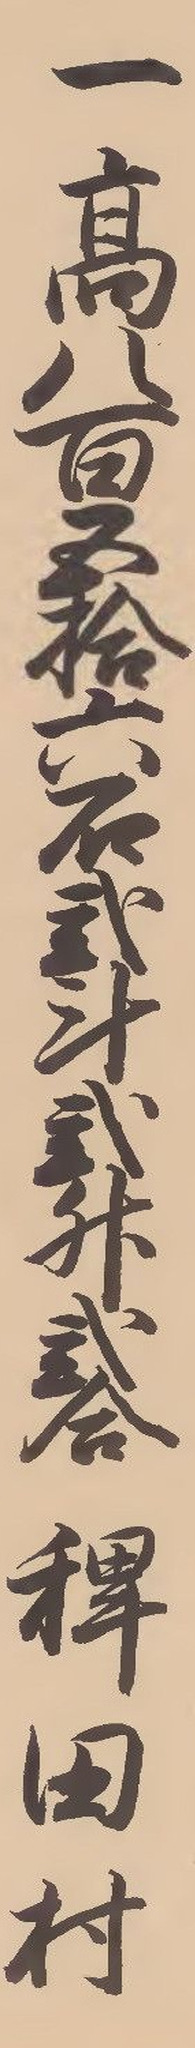一髙八百五拾六石弐斗弐升弐合稗田村
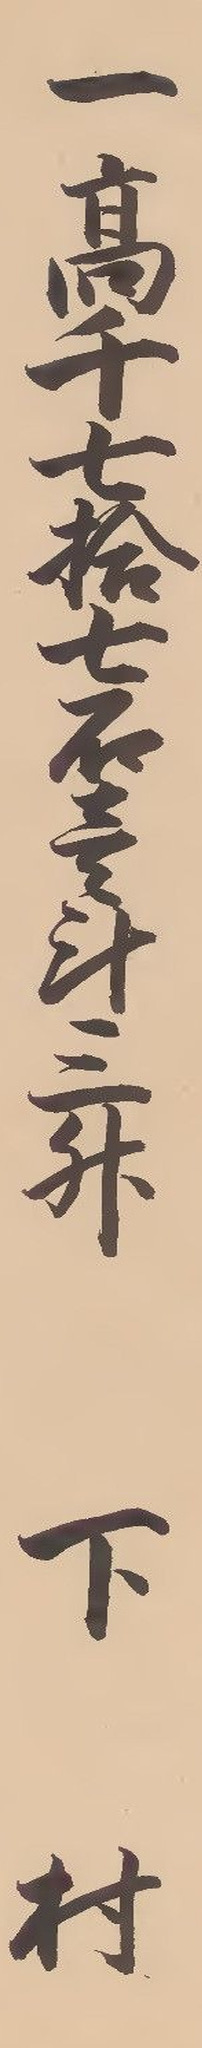一髙千七拾七石壱升三合下村
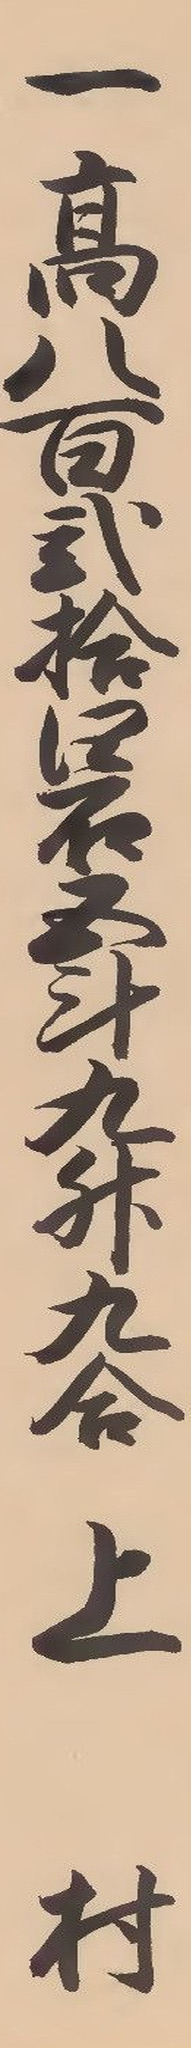一髙八百弐拾四石五斗九升九合上村
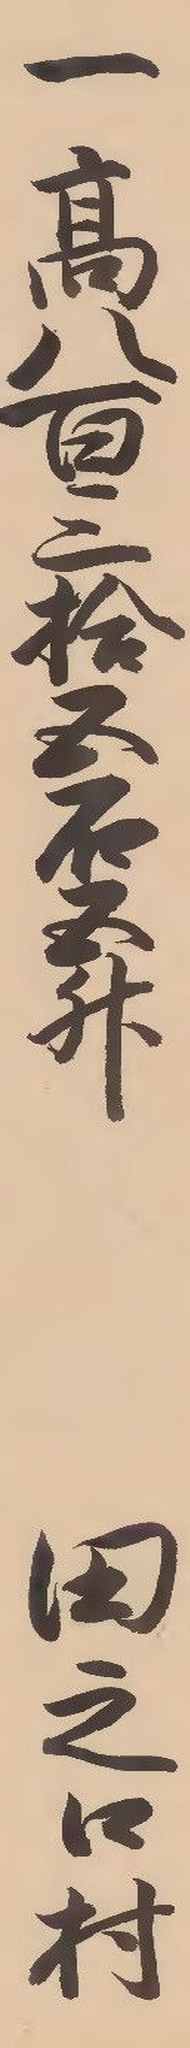一髙八百三拾五石五升田之口村
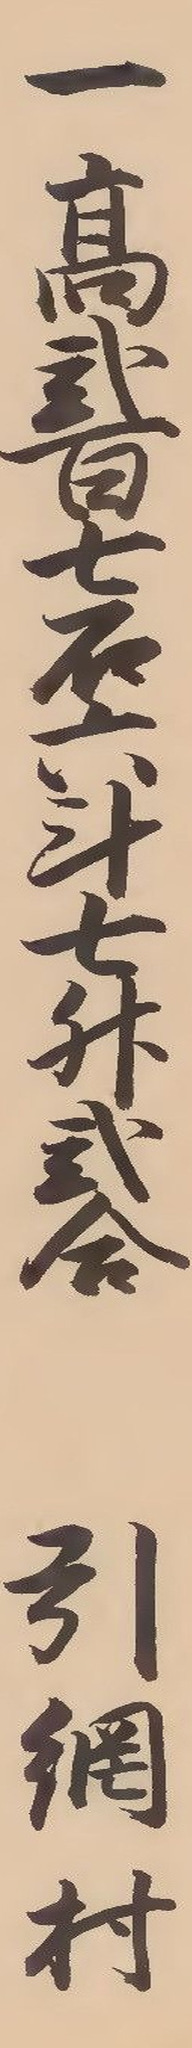一髙弐百七石六斗七升弐合引網村
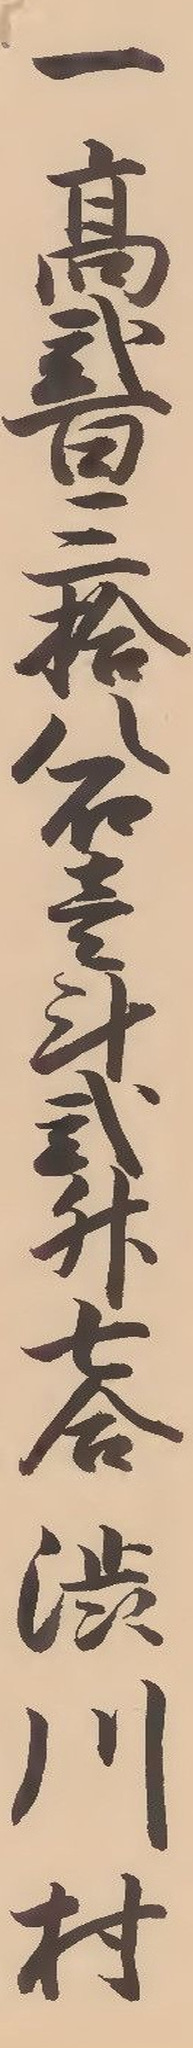一髙弐百三拾八石壱斗弐升七合渋川村

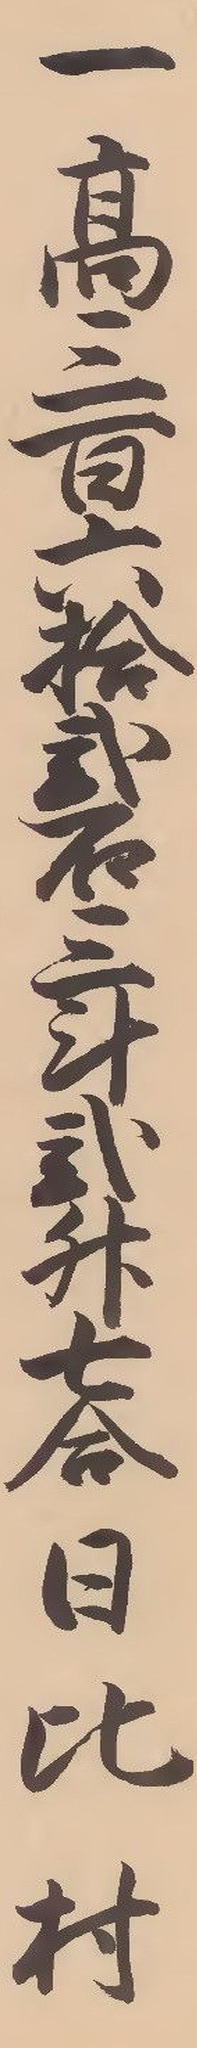一髙三百六拾弐石三斗弐升七合日比村
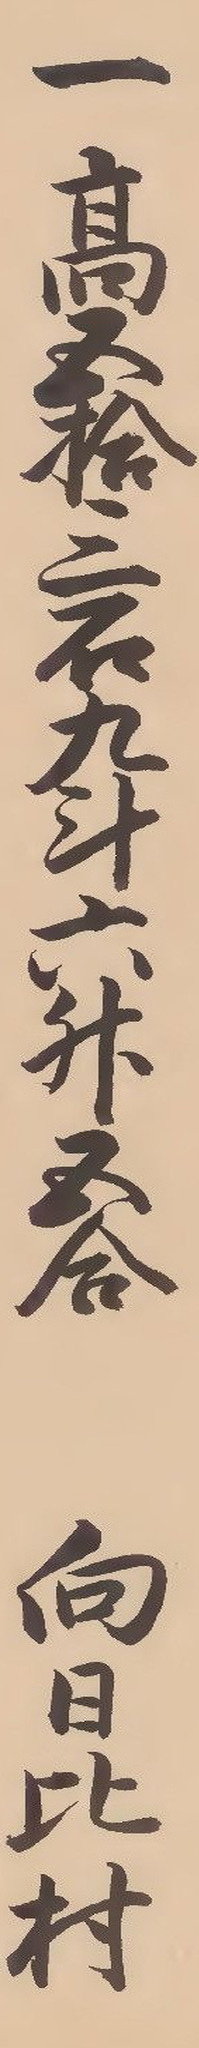一髙五拾三石九斗六升五合向日比村
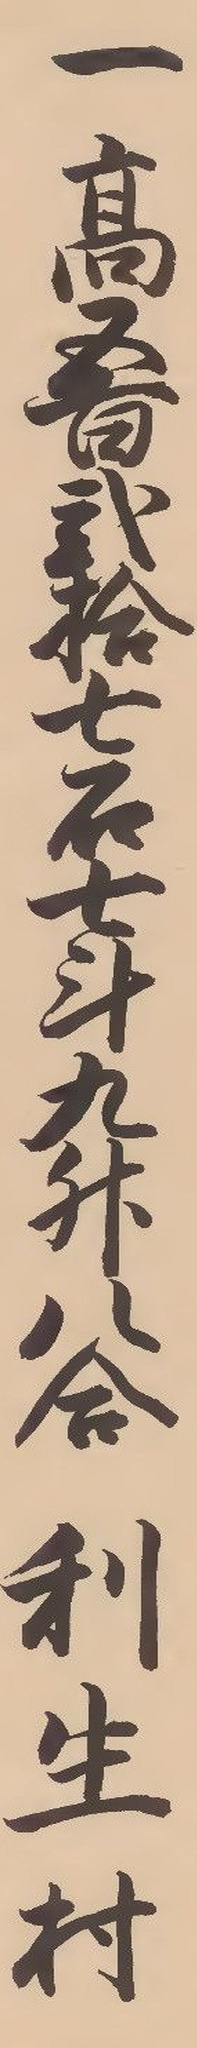一髙五百弐拾七石七斗九升八合利生村
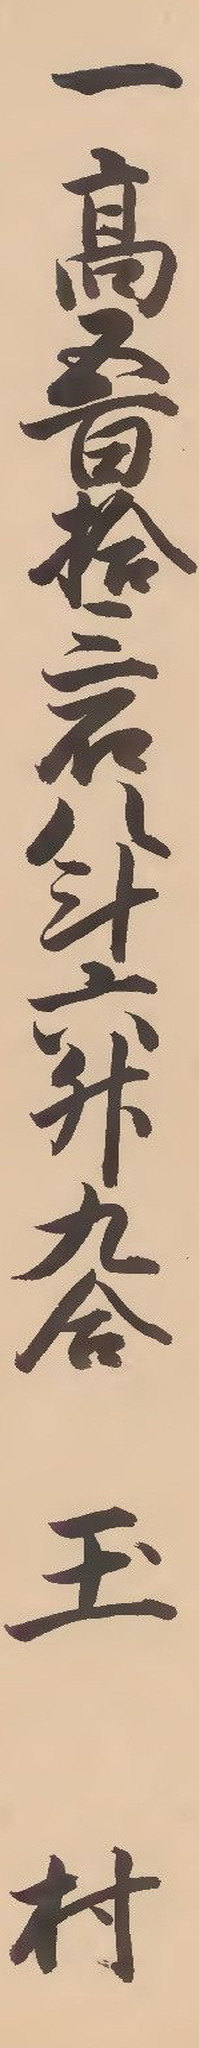一髙五百拾三石八斗六升九合玉村
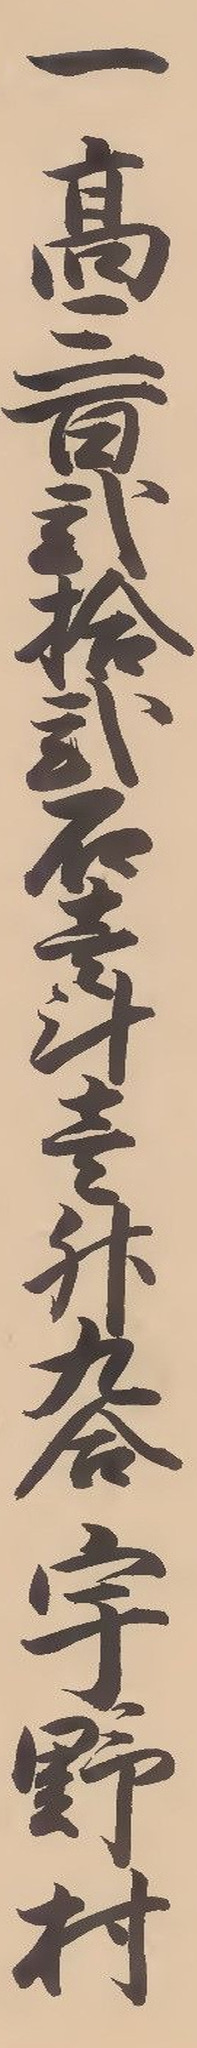一髙三百弐拾弐石壱斗壱升九合宇野村
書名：備前国郷帳
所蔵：国立公文書館 National Archives of Japan
